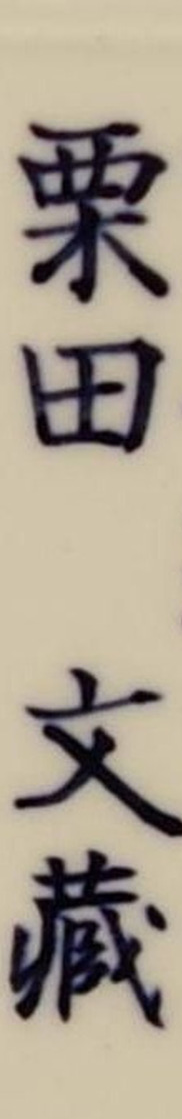栗田文蔵
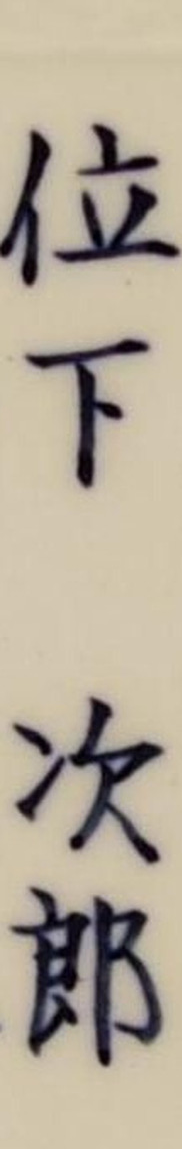位下次郎
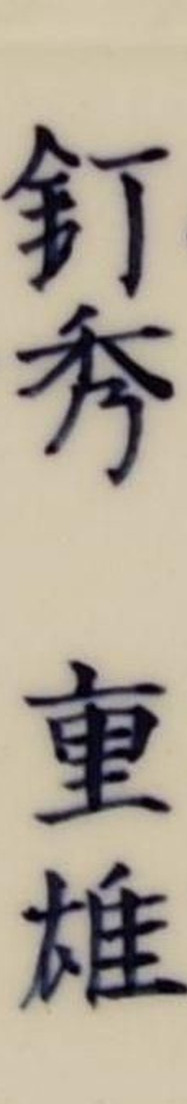釘秀重雄
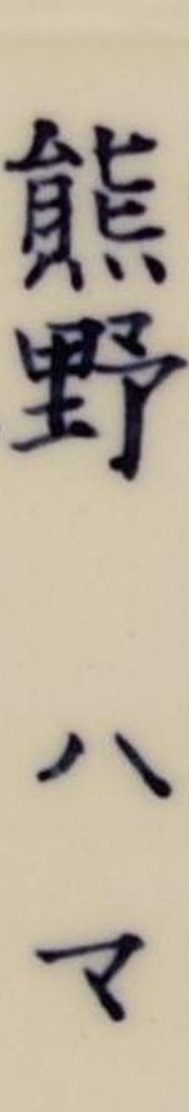熊野ハマ
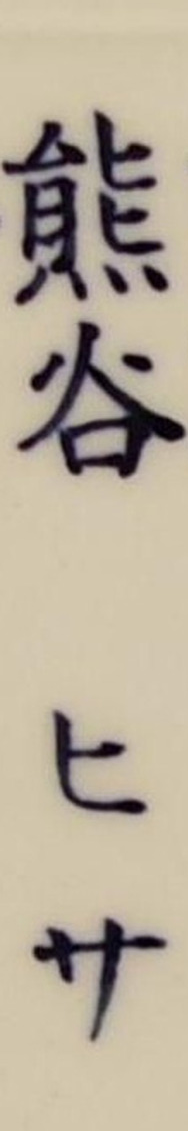熊谷ヒサ
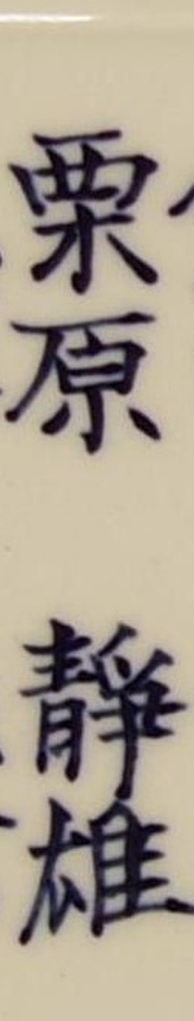栗原静雄
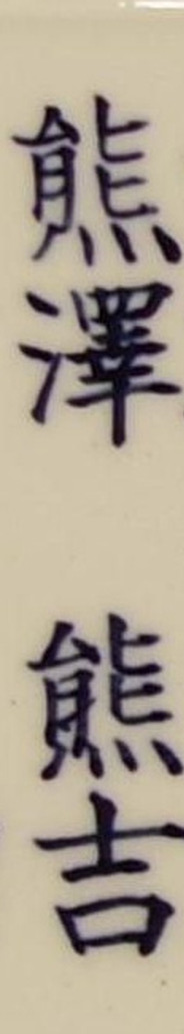熊澤熊吉
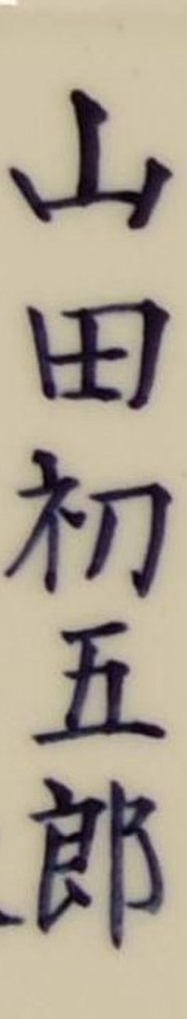山田初五郎
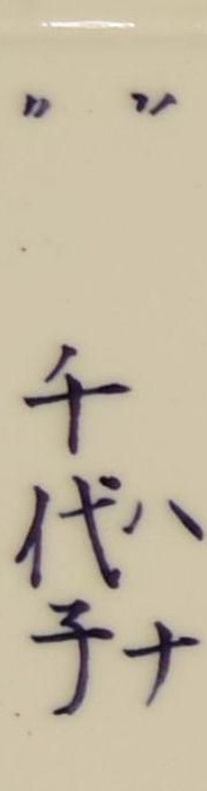千代子
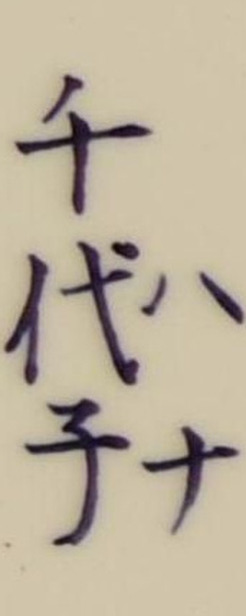千代子

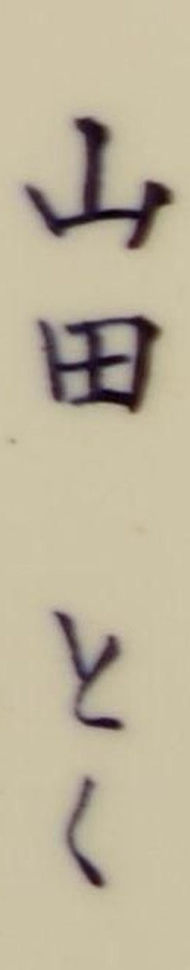山田とく
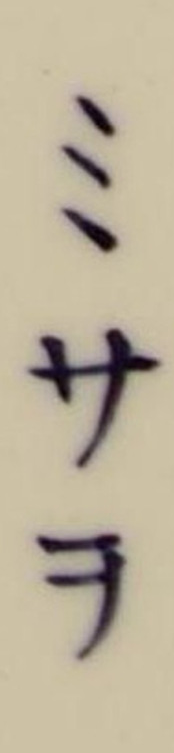ミサヲ
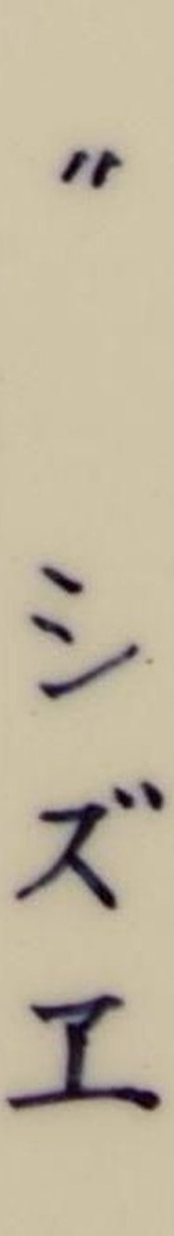シズエ
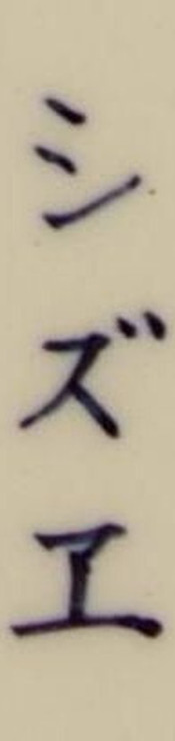シズエ
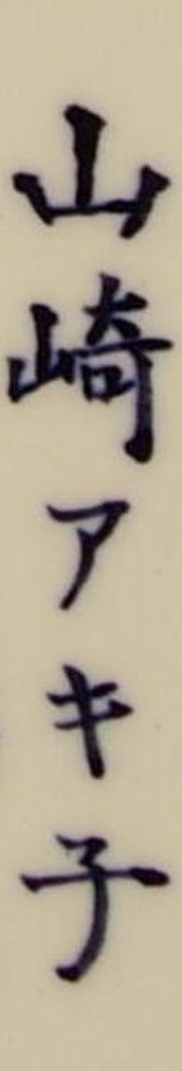山崎アキ子
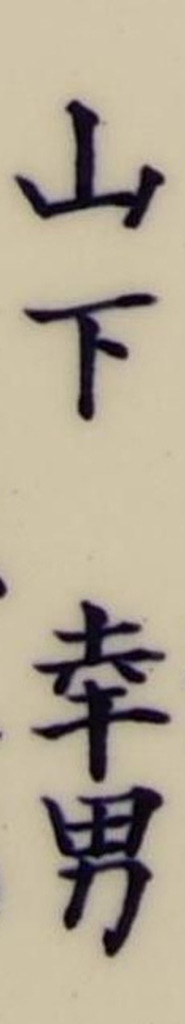山下幸男
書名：E~L
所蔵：高野山金剛峯寺
